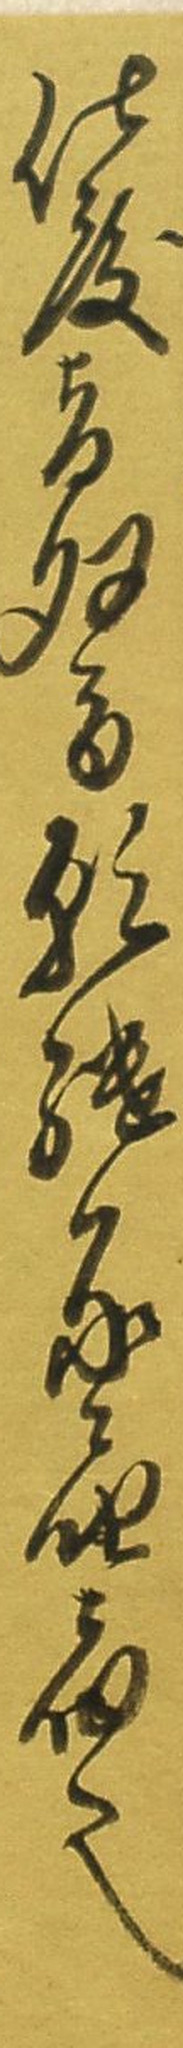仕度旨双方願遣承届者也
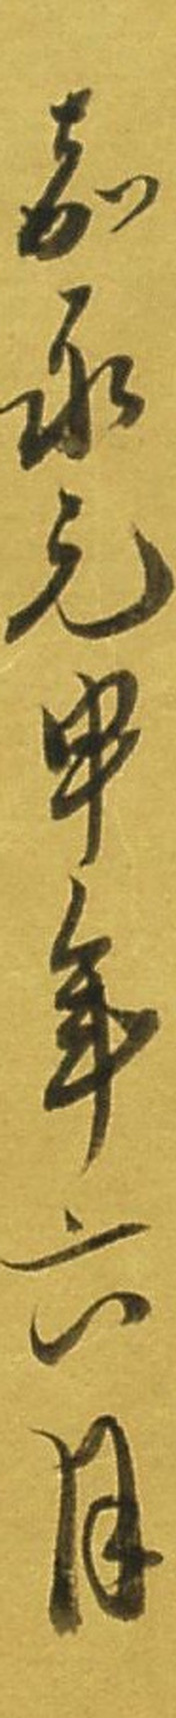嘉永元申年六月
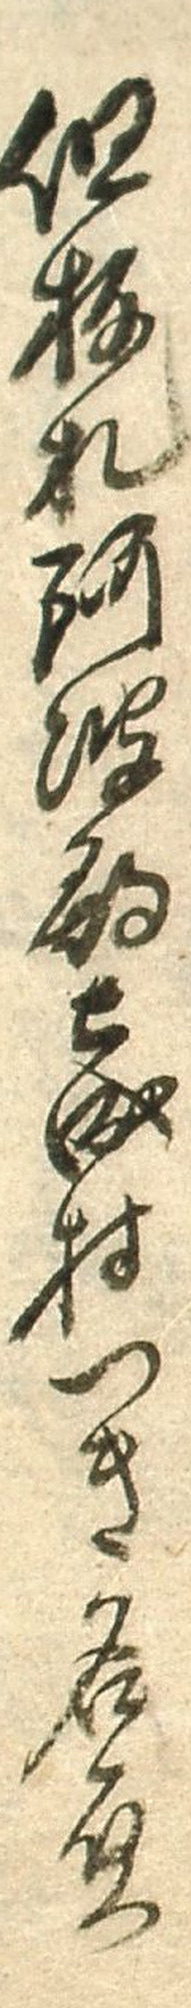但板札阿波郡土成村つき名
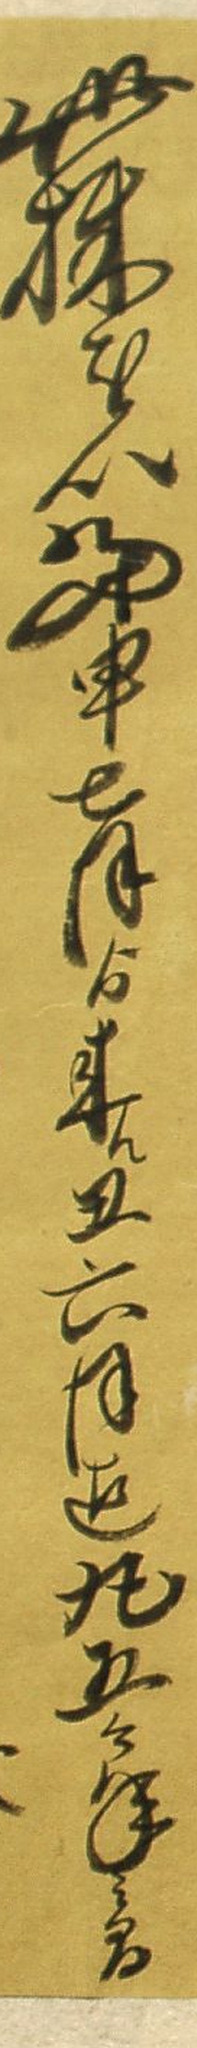此株を以当申七月より来る丑六月迄丸五ヶ年之間
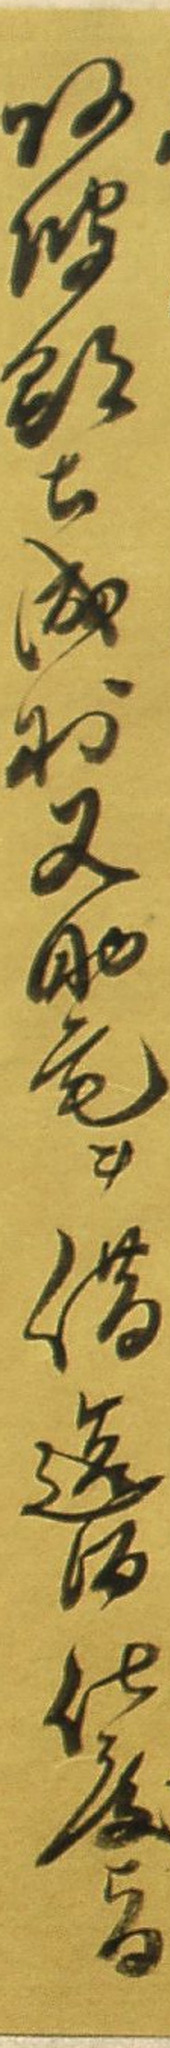阿波郡土成村又助宅を借造酒仕度旨
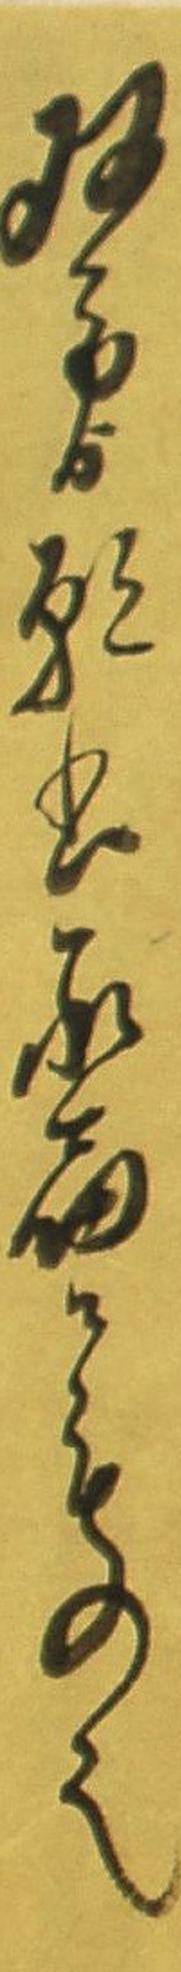双方より願出承届候もの也
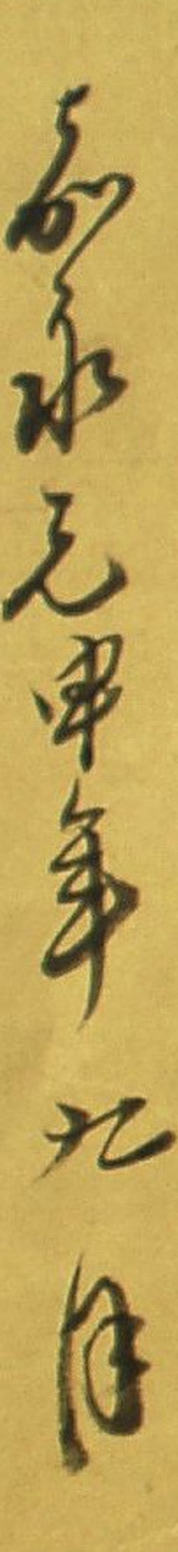嘉永元申年九月

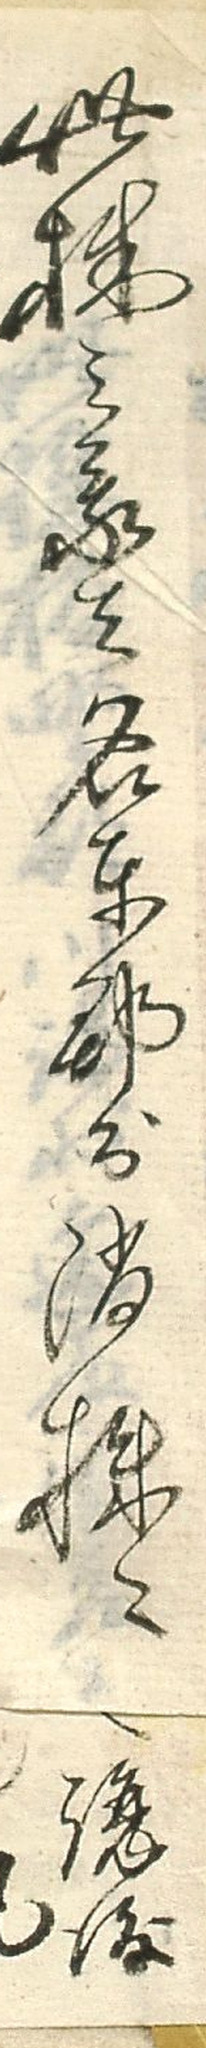此株之義は名東郡分消株に
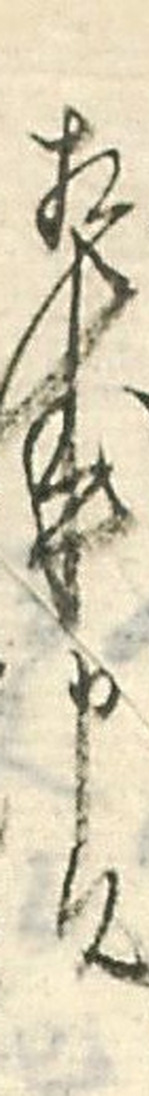相成申候
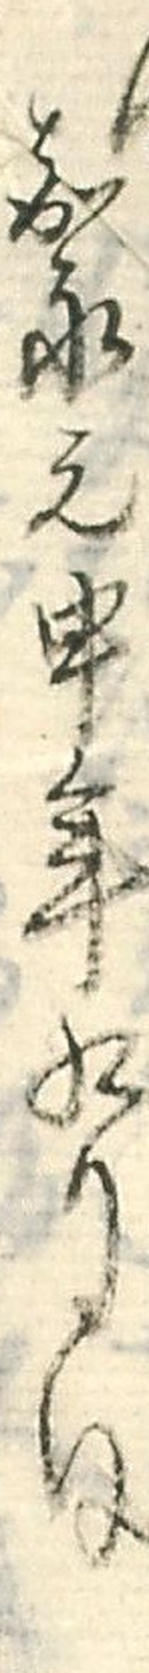嘉永元申年九月改
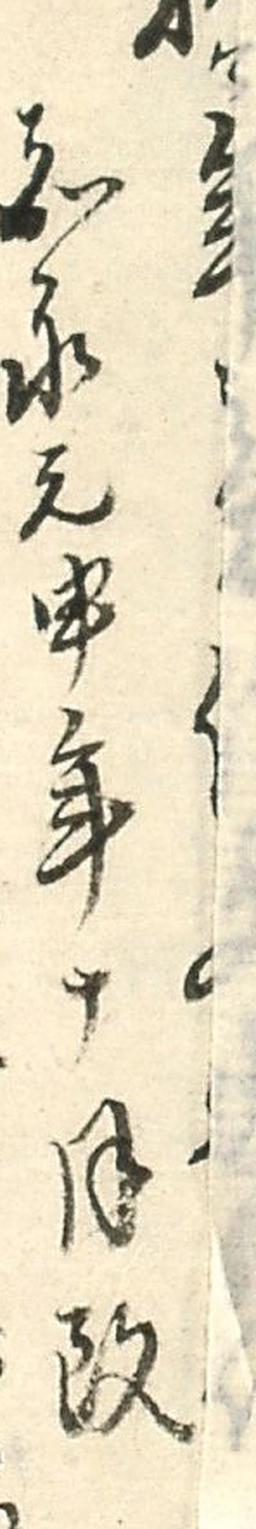嘉永元申年九月改

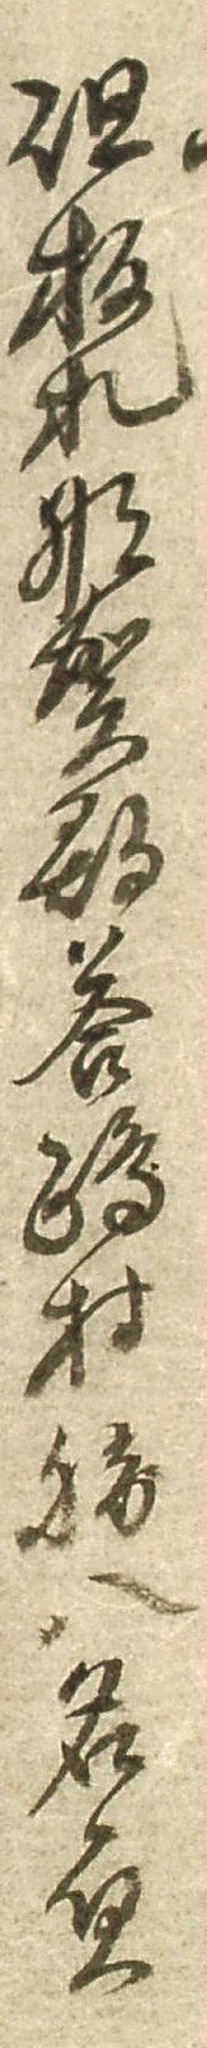但板札那賀郡答嶋村勝八名
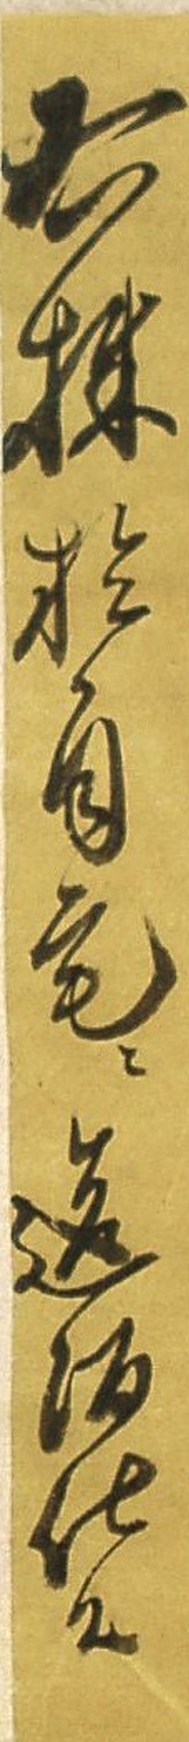右株於自宅造酒仕候
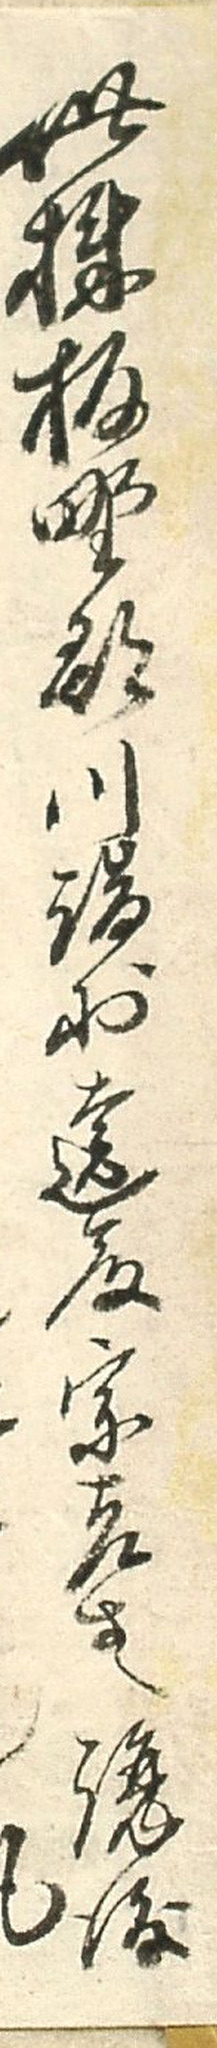此株板野郡川端村遠藤宗吉方へ譲渡
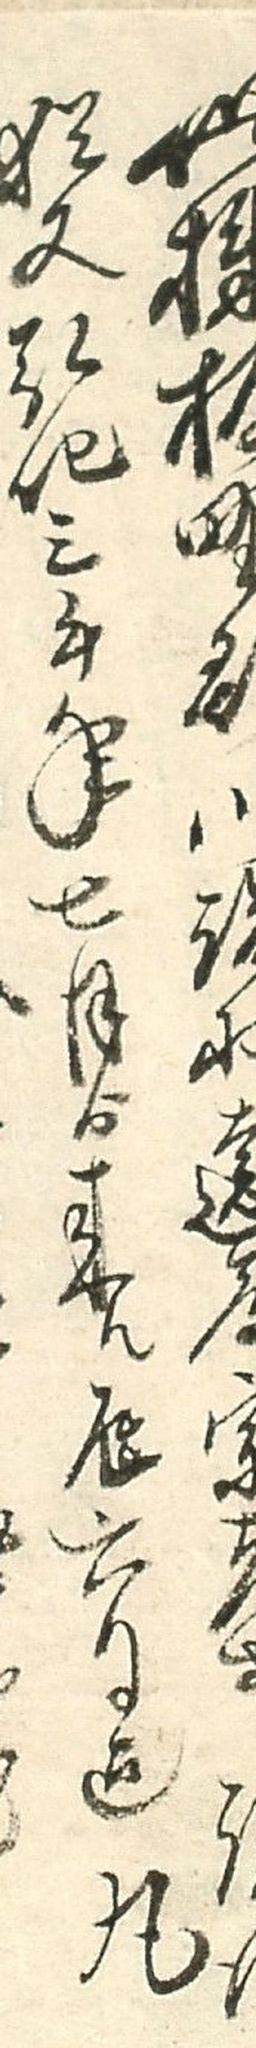猶又弘化三午年七月より来る辰六月迄丸
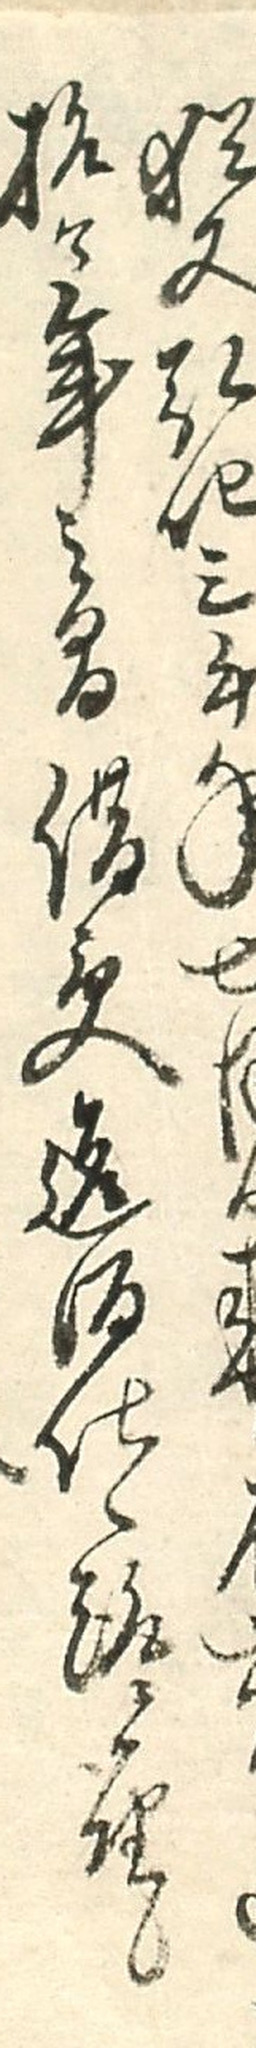拾ヶ年之間借受造酒仕候趣に御座候
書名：名東郡中酒株並造酒屋軒数取調帳
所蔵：鳴門教育大学 Naruto University of Education
